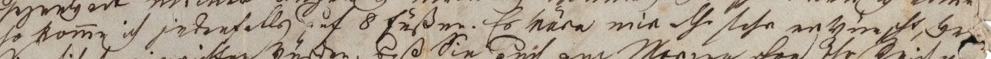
so komme ich jedenfalls auf 8 Füßen. Es wäre mir also sehr erwünscht, wenn
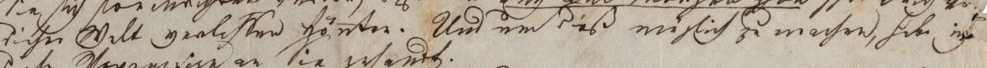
dieser Welt verlassen könnten. Und um dieß möglich zu machen, habe ich
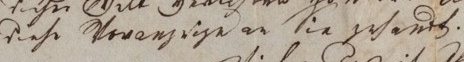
diese Voranzeige an Sie gesandt.
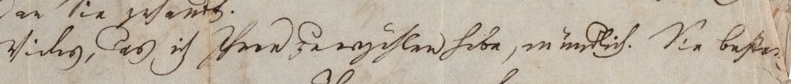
Vieles, das ich Ihnen zu erzählen habe, mündlich. Sie bestens
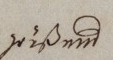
grüßend
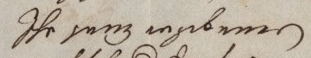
Ihr ganz ergebener
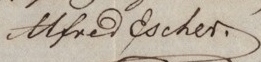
Alfred Escher.
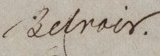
Belvoir
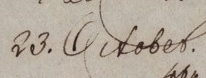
23. October
